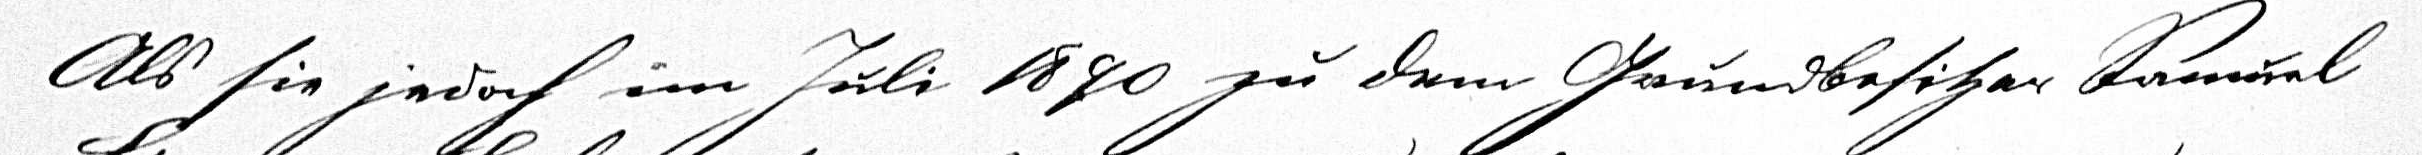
Als sie jedoch im Juli 1890 zu dem Grundbesitzer Samuel
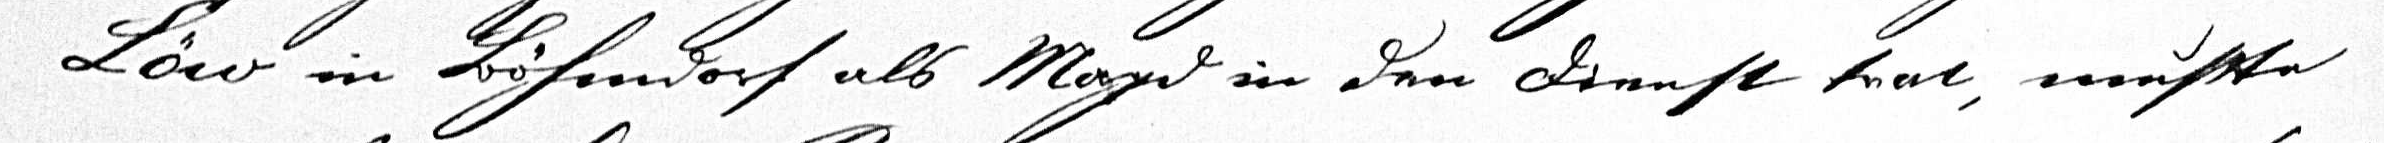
Löw in Böhmdorf als Magd in den Dienst trat, mußte
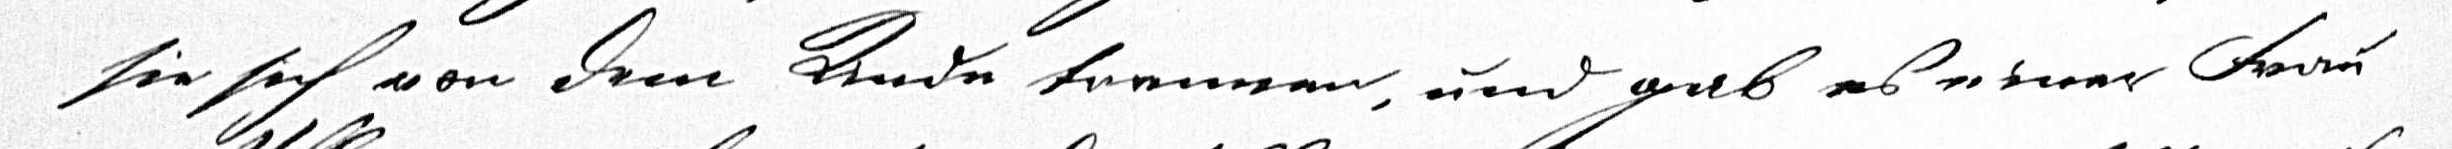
sie sich von dem Kinde trennen, und gab es einer Frau
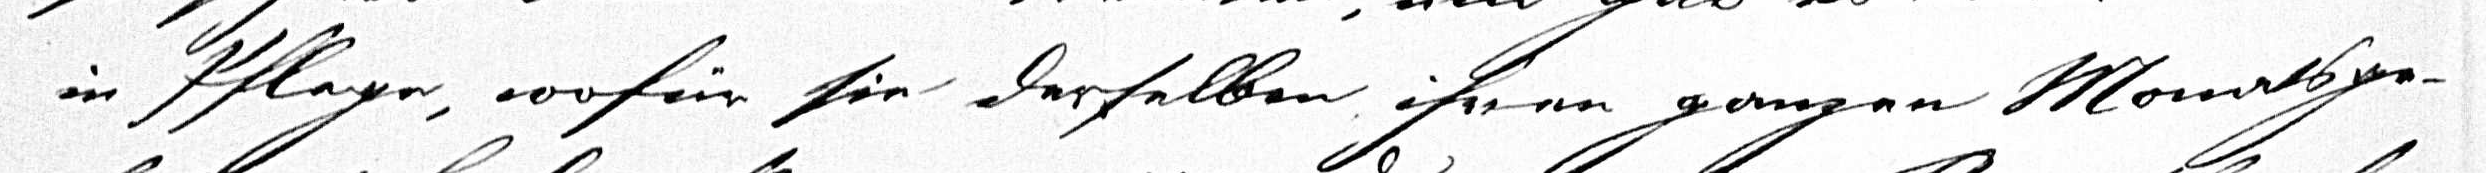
in Pflege, wofür sie derselben ihren ganzen Monatsge¬
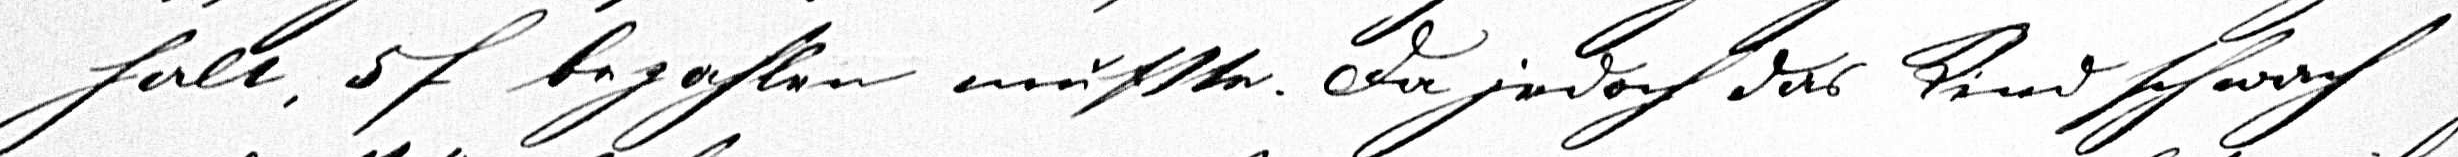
halt, 5f bezahlen musste. Da jedoch das Kind schwach
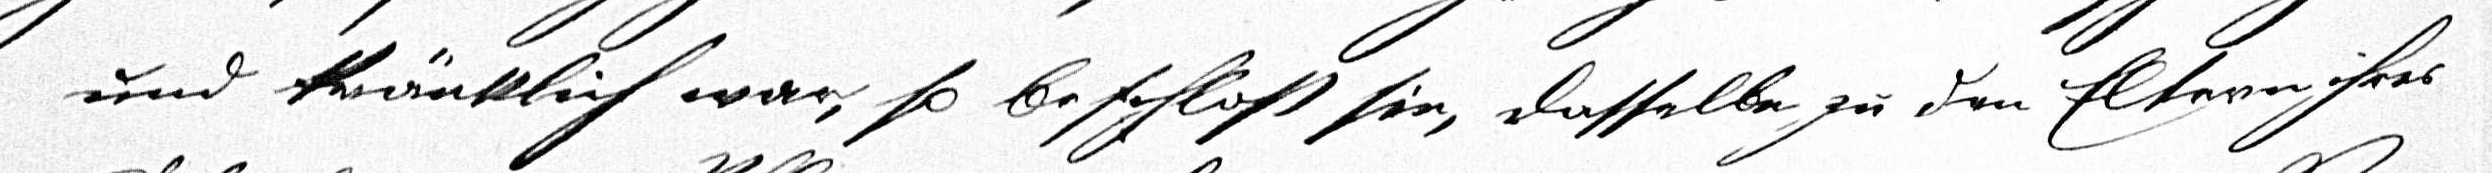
und kränklich war, so beschloß sie, dasselbe zu den Eltern ihrer
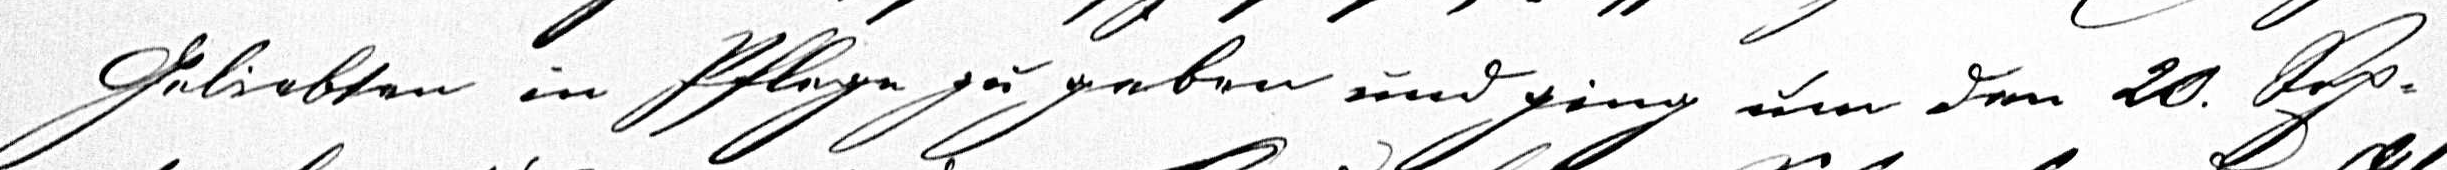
Geliebten in Pflege zu geben und ging um dem 20 Sep¬
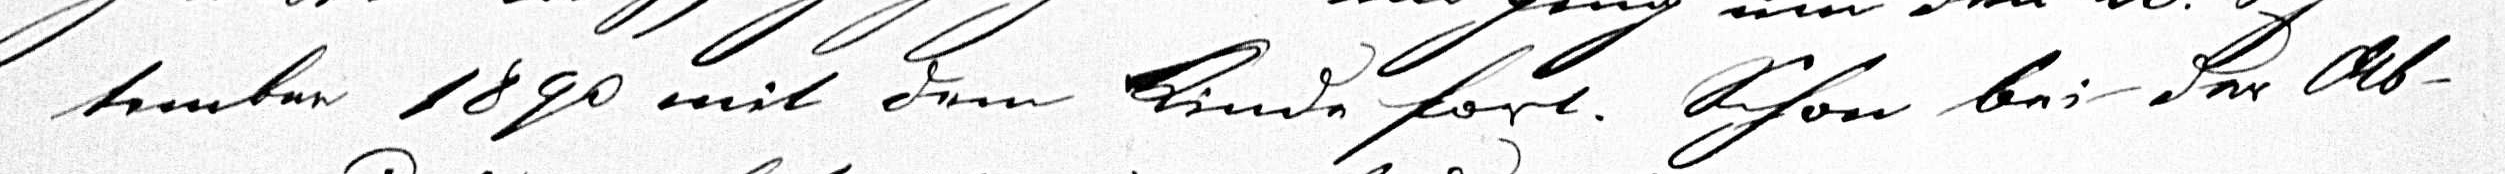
tember 1890 mit dem Kinde fort. Schon bei der Ab¬
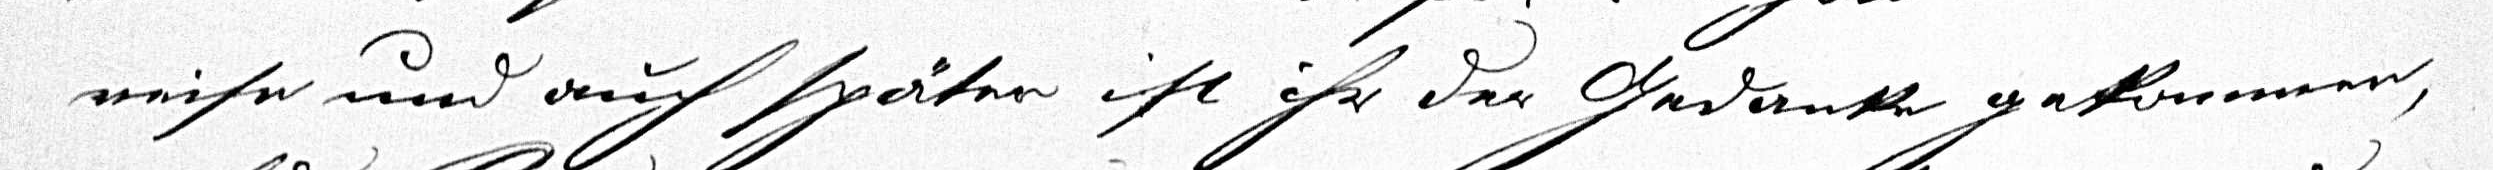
reise und auch später ist ihr der Gedanke gekommen,
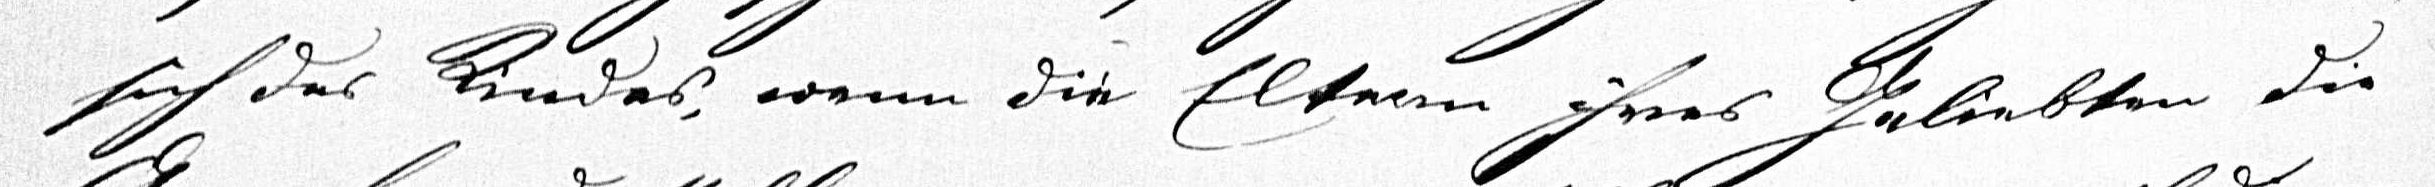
sich des Kindes, wenn die Eltern ihres Geliebten die
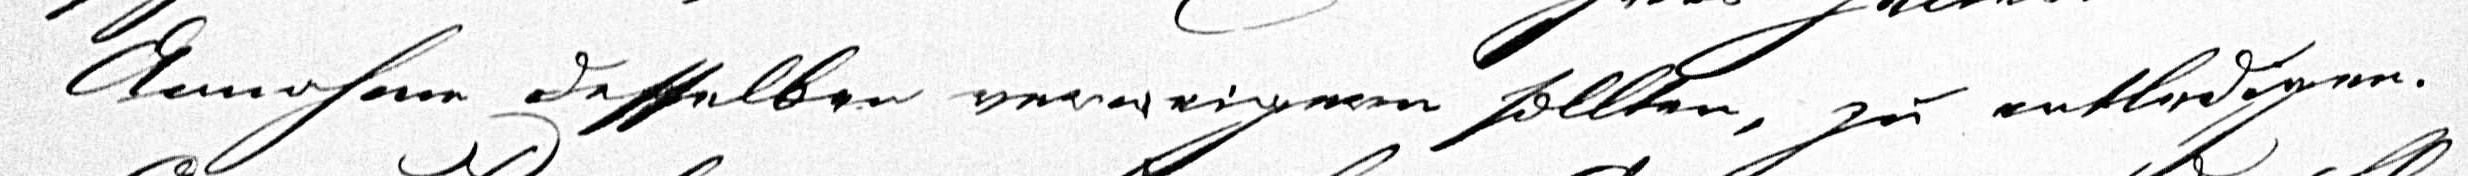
Annahme dasselbe verweigern sollten, zu entledigen.
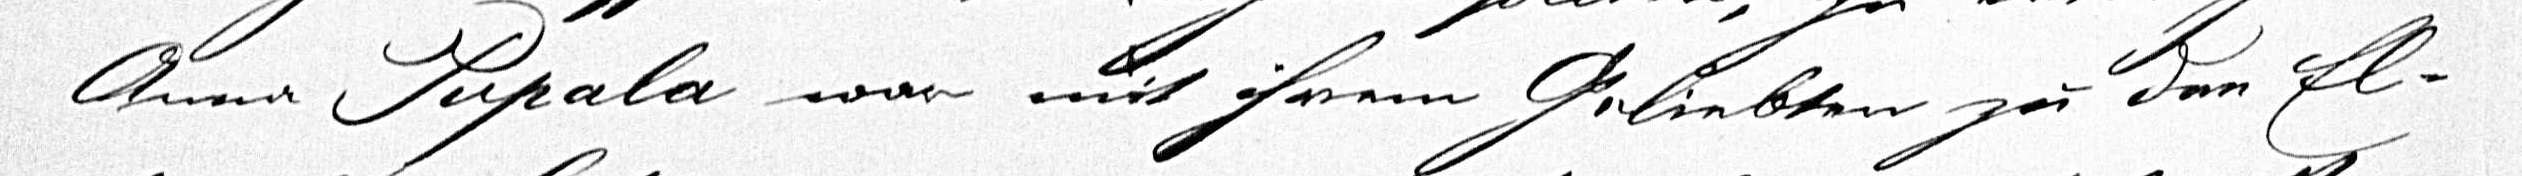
Anna Pupala war mit ihrem Geliebten zu den El¬
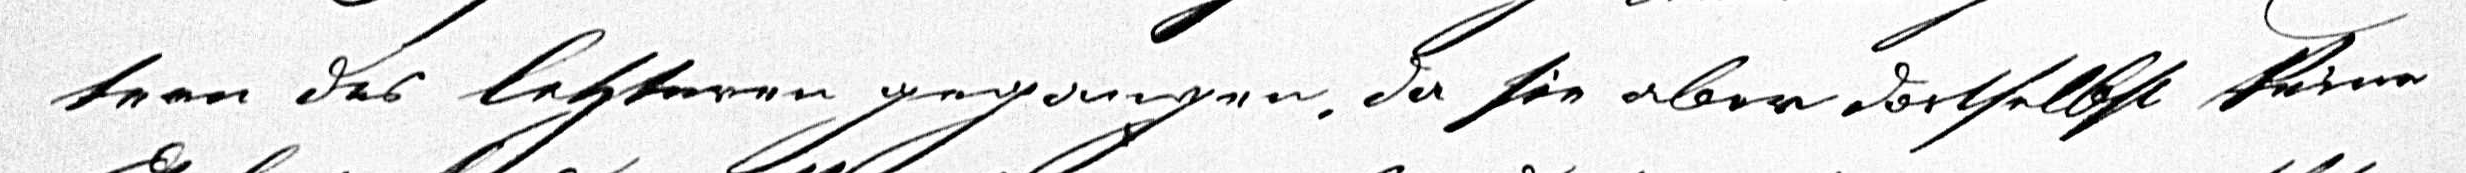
tern des letzteren gegangen, da sie aber dortselbst keine
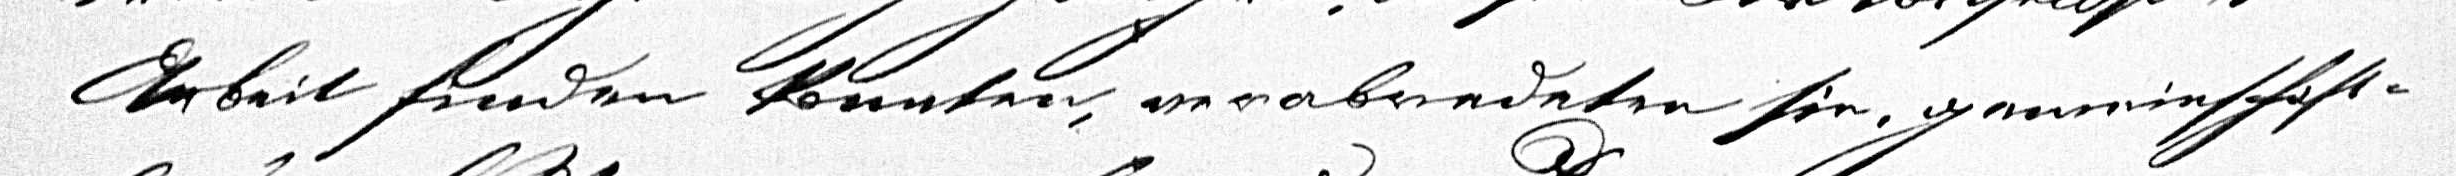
Arbeit finden konnten, verabredeten sie, gemeinschaft¬
